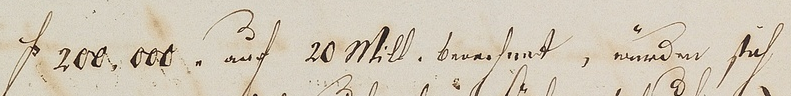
f 200.000 " auf 20 Mill. berechnet, würden sich
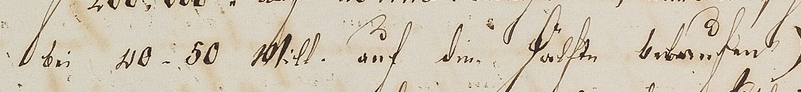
bei 40–50 Mill. auf die Hälfte belaufen)
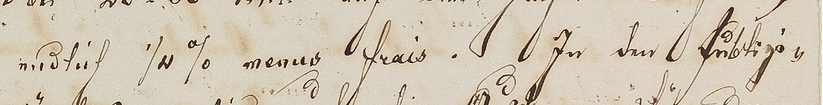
endlich ¼% menus frais. In den Publizi-
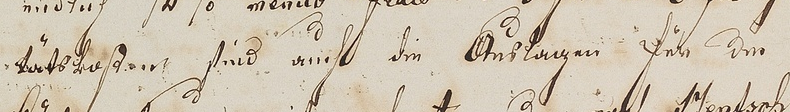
tätskosten sind auch die Auslagen für die
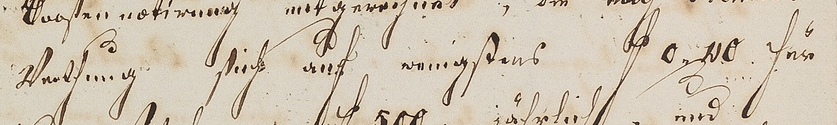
Werthung sich auf wenigstens f 0"40 für
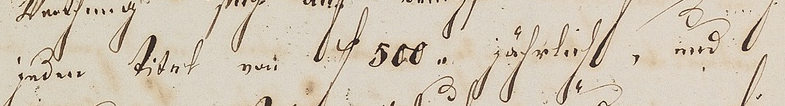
jeden Titel von f 500 " jährlich, und
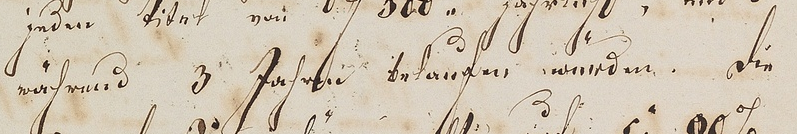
während 3 Jahren belaufen würden. Die
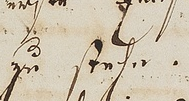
zu stehn.
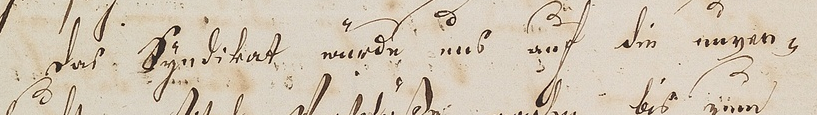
Das Syndikat würde uns auf die unver-
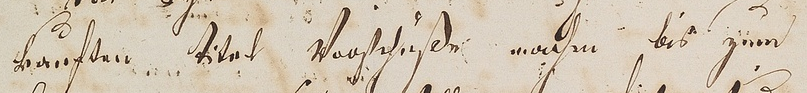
kauften Titel Vorschüße machen bis zum
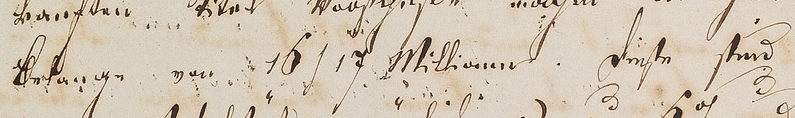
Belange von 16/17 Millionen. Diese sind
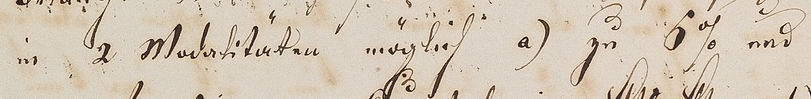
in 2 Modalitäten möglich a) zu 6% und
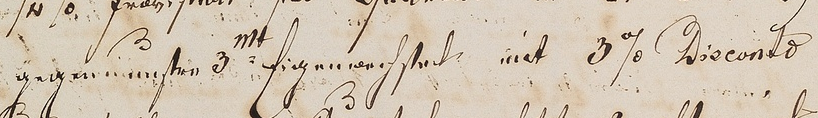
gegen unsre 3mt Eigenwechsel mit 3% Disconto
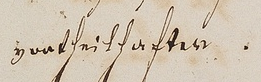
vortheilhafter.
